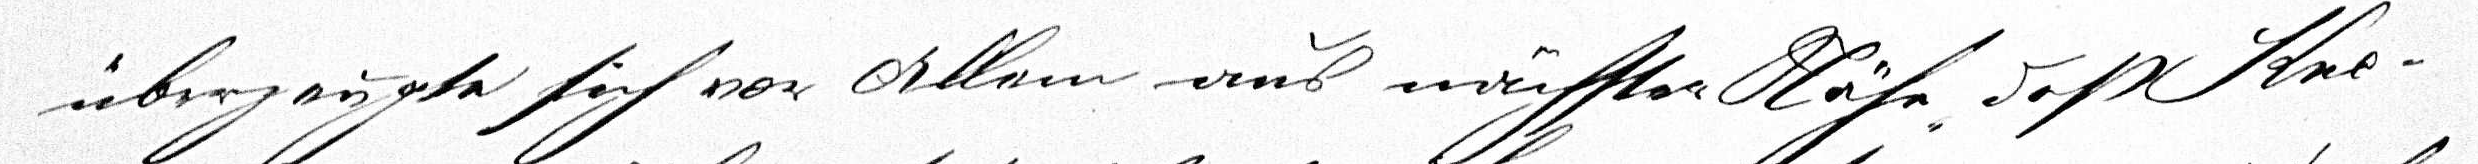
überzeugte sich vor Allem aus nächster Nähe, daß Kne¬
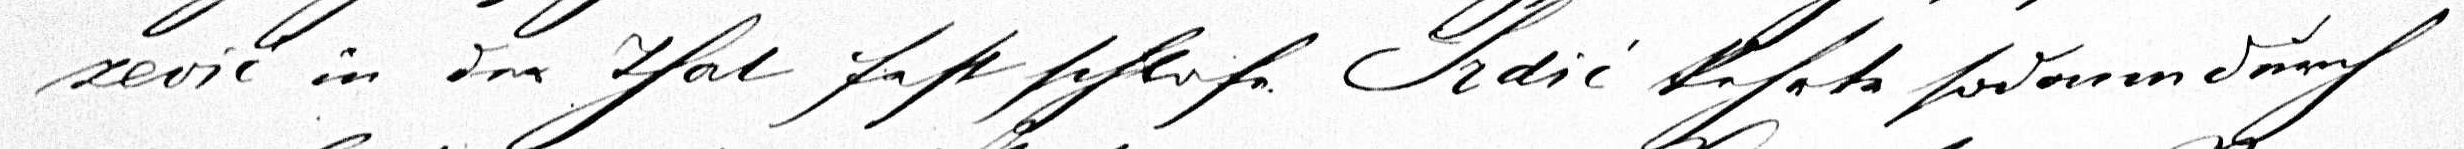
zevic in der That fest schlafe. Srdić kehrte sodann durch
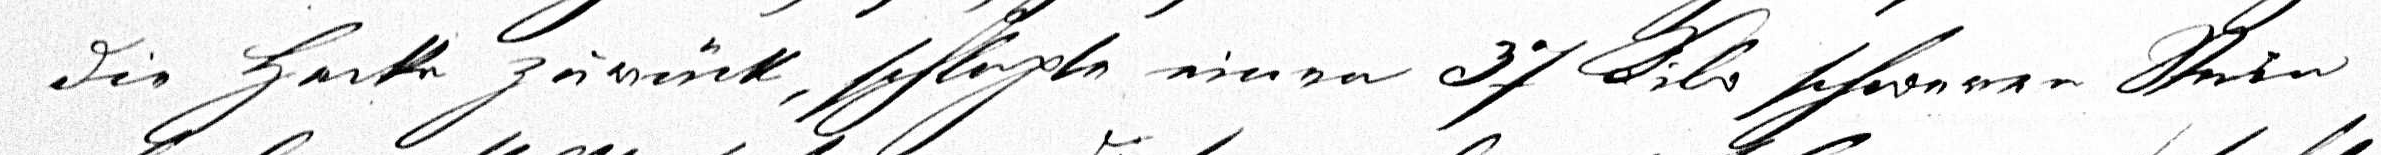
die Hecke zurück, schlepte einen 3°f Kilo schweren Stein
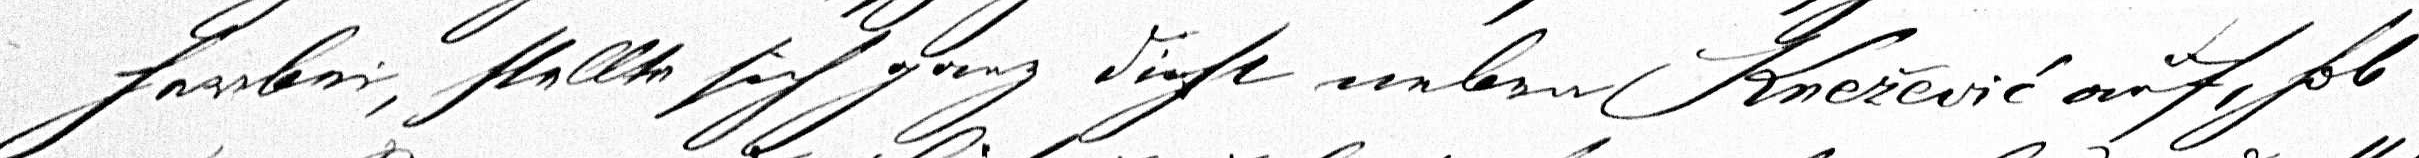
herbei, stellte sich ganz dicht neben Knežević auf, hob
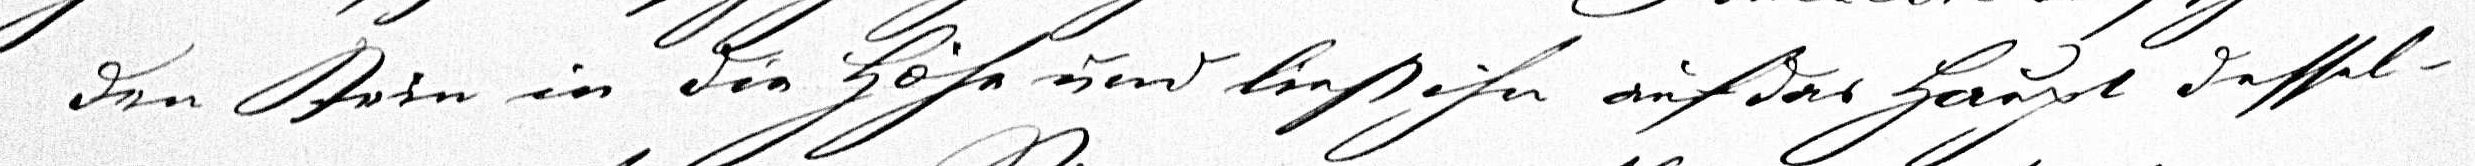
den Stein in die Höhe und ließ ihn auf das Haupt dessel¬
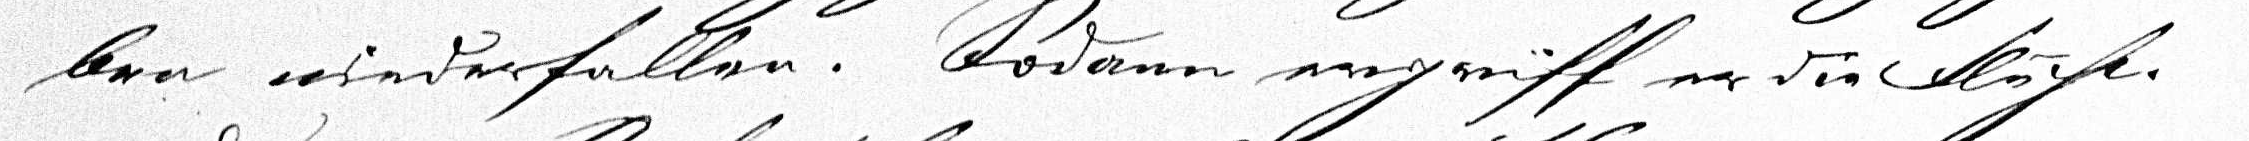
ben niederfallen. Sodann vergriff er die Flucht.
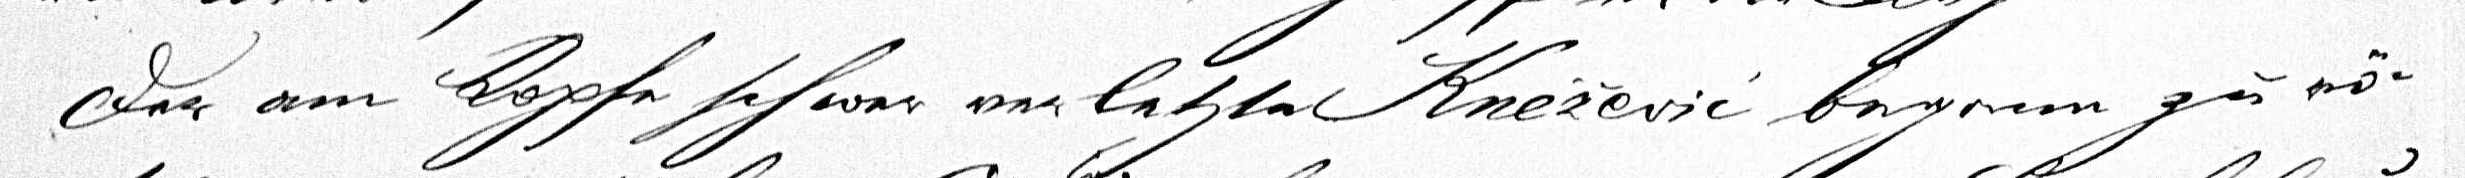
Der am Kopfe schwer verletzte Knežević begann zu rö¬
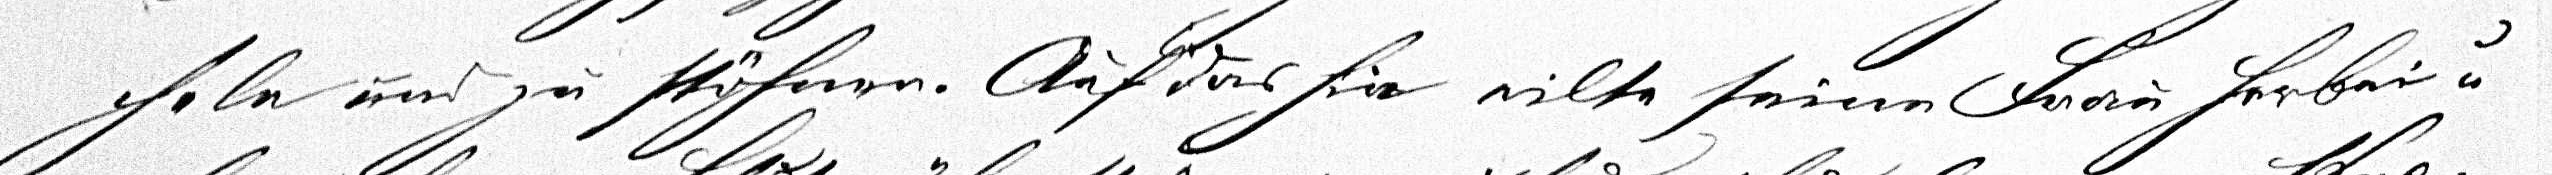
cheln und zu stöhnen. Auf das hin eilte seine Frau herbei u
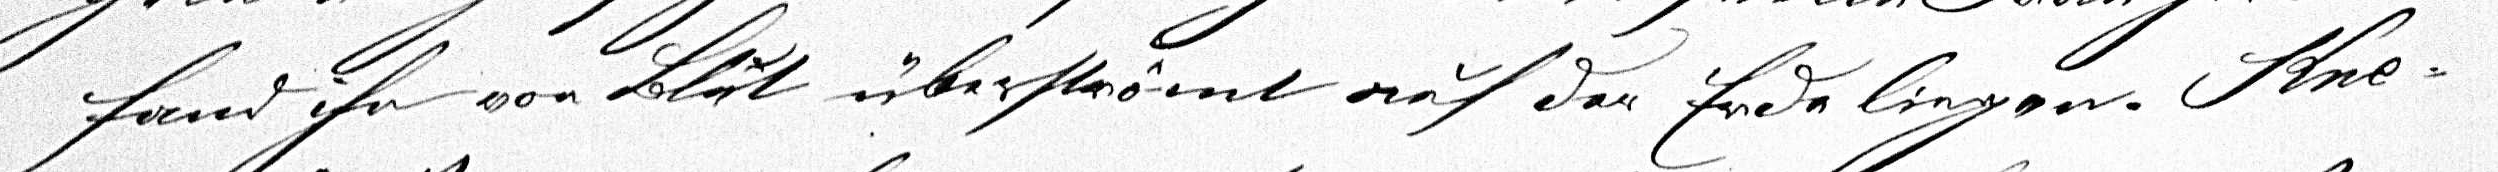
fand ihn von Blut überströmt auf der Erde liegen. Kne¬
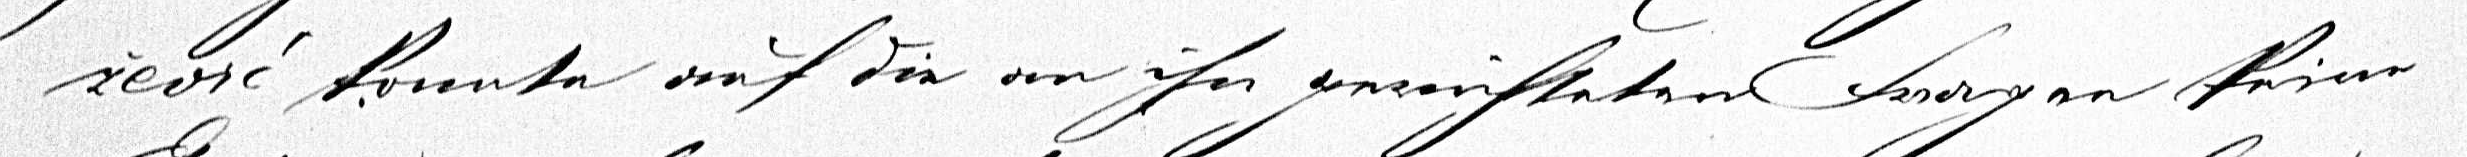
žević konnte auf die an ihn gerichteten Fragen keine
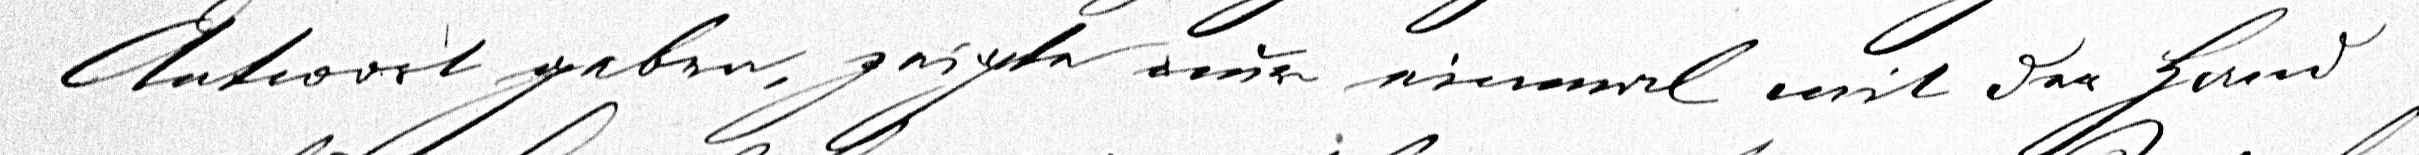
Antwort geben, zeigte nur einmal mit der Hand
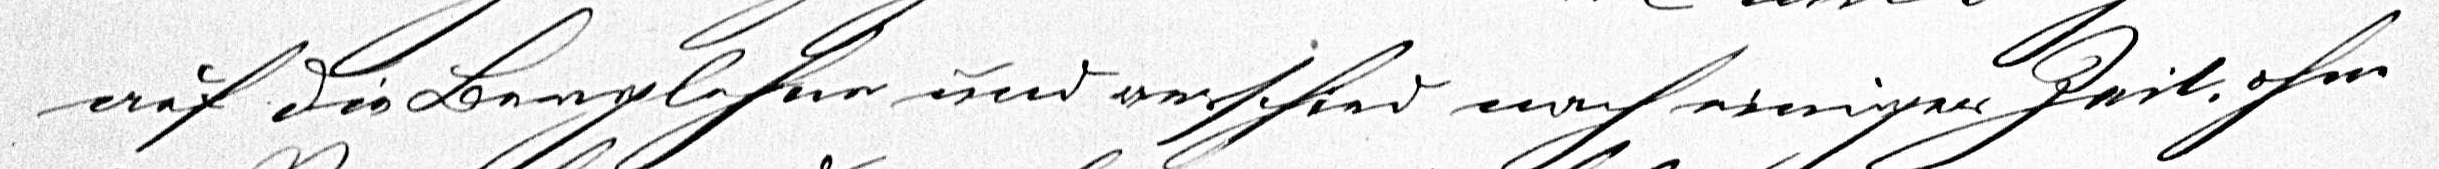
auf die Berglehen und verschied nach einiger Zeit, ohne
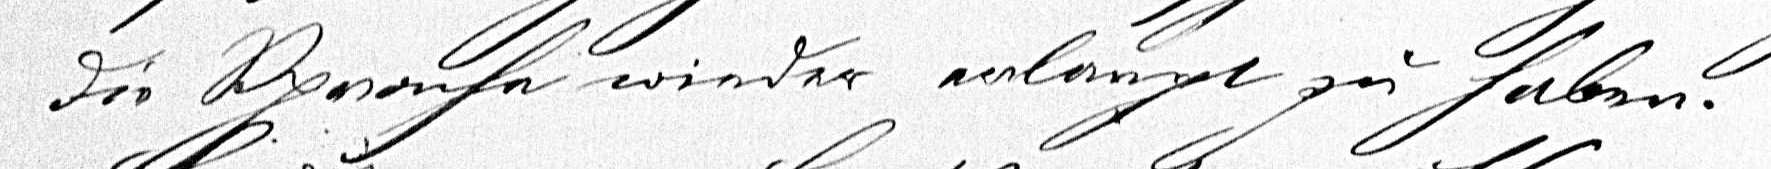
die Sprache wieder erlangt zu haben.
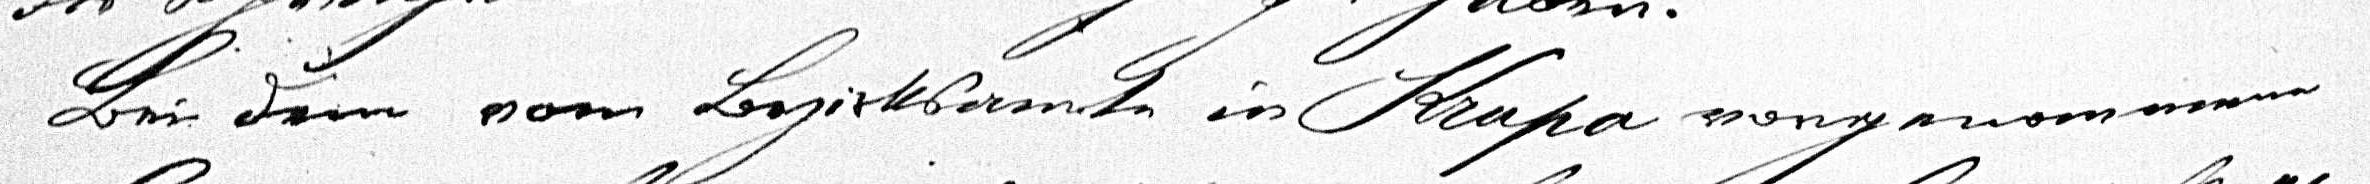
Bei dem vom Bezirkamte in Krupa vorgenommene
